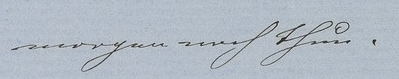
morgen noch thun.
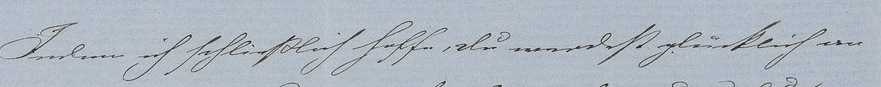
Indem ich schließlich hoffe, Du werdest glücklich an
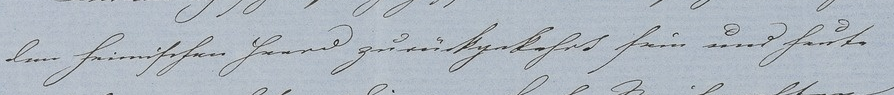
den heimischen Heerd zurückgekehrt sein und heute
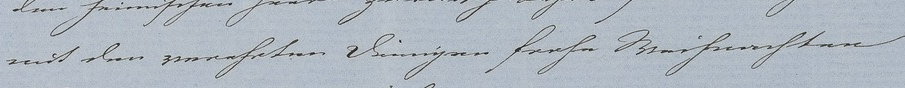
mit den verehrten Deinigen frohe Weihnachten
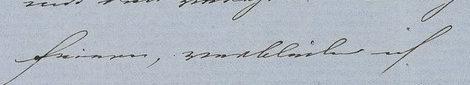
feiern, verbleibe ich
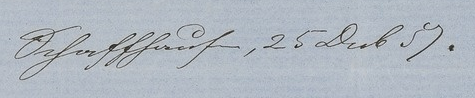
Schaffhausen, 25 Decb 57.
